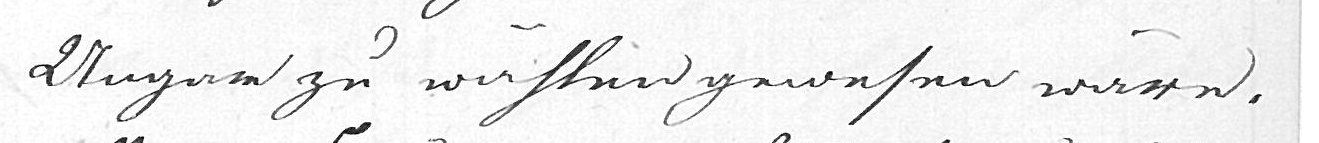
Ungar zu wählen gewesen wäre.
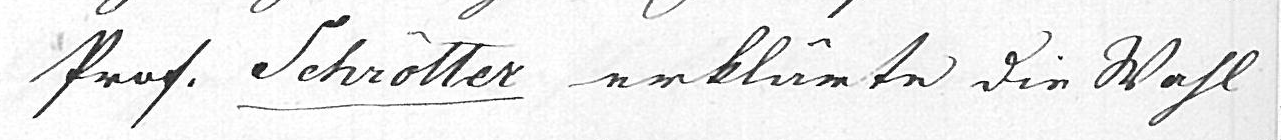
Prof. Schrötter erklärte die Wahl
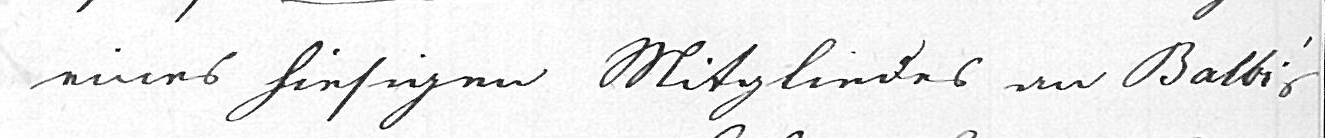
eines hiesigen Mitgliedes an Balbi's
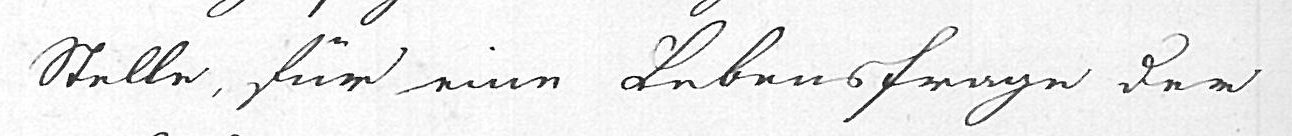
Stelle, für eine Lebensfrage der
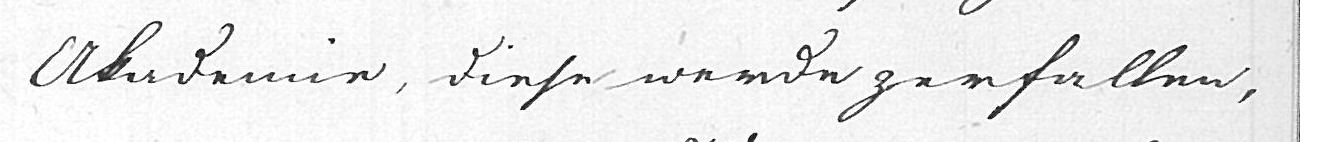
Akademie, diese werde zerfallen,
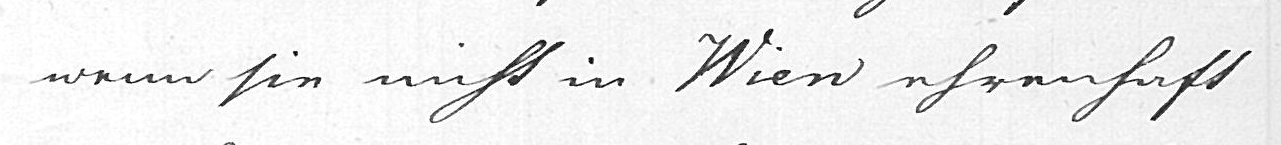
wenn sie nicht in Wien ehrenhaft
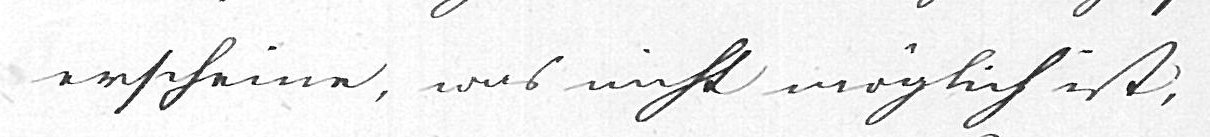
erscheine, was nicht möglich ist,
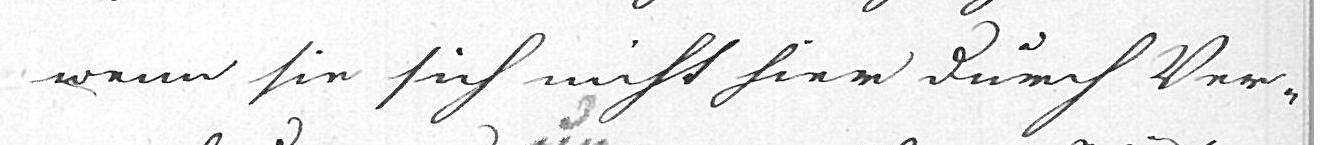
wenn sie sich nicht hier durch Ver-
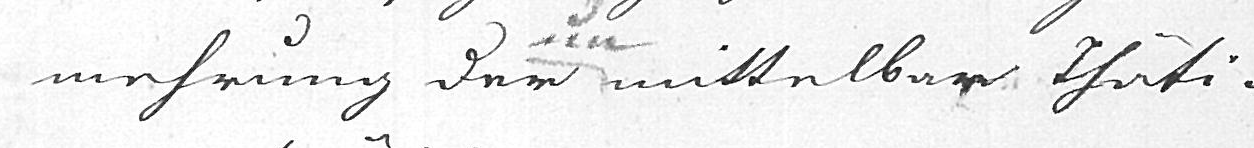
mehrung der unmittelbar Thäti-
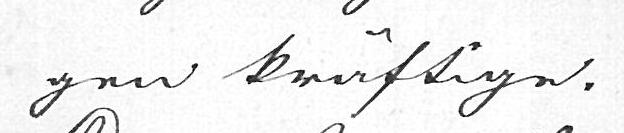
gen kräftige.
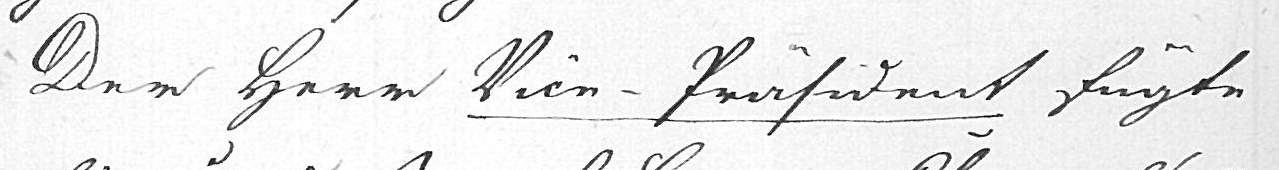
Der Herr Vice-Präsident fügte
